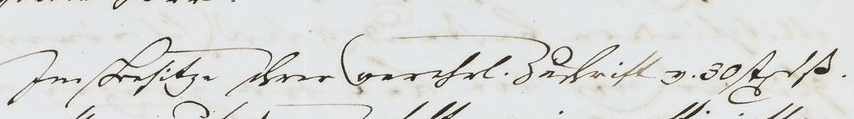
Im Besitze Ihrer verehrl. Zuschrift v. 30sten dß.
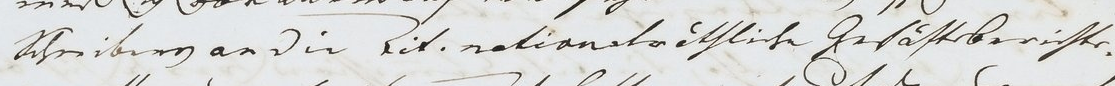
Schreibens an die Tit. nationalräthliche Geschäftsberichts-
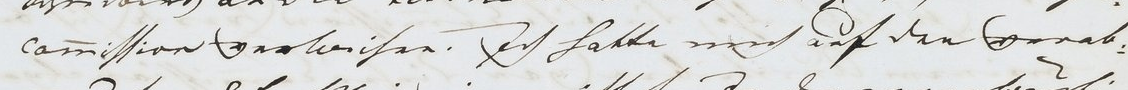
commission verweisen. Ich hatte mich auf den verab-
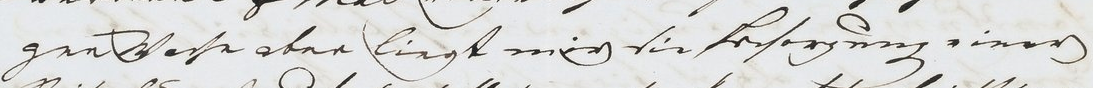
gen Woche aber liegt mir die Besorgung einer
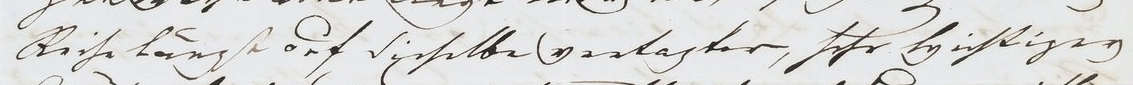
Reihe längst auf dieselbe vertagter, sehr wichtiger
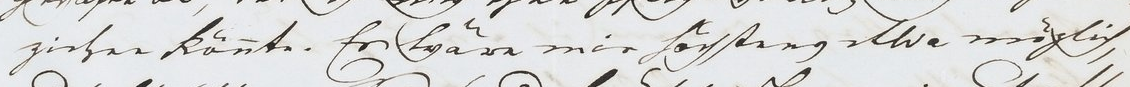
ziehen könnte. Es wäre mir höchstens etwa möglich,
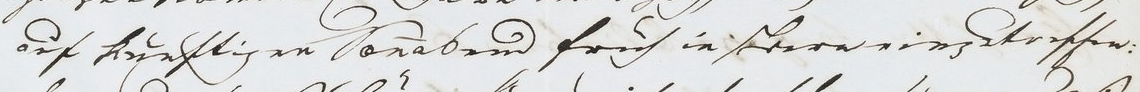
auf künftigen Sonnabend früh in Bern einzutreffen:
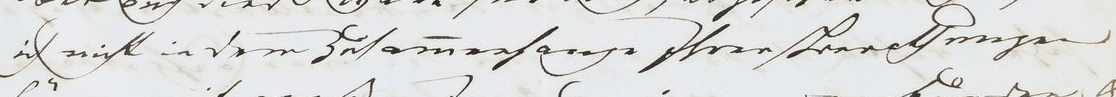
ich nicht in dem Zusammenhange Ihrer Berathungen
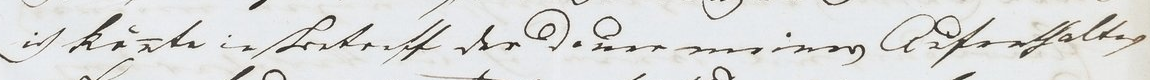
ich könnte in Betreff der Dauer meines Aufenthaltes
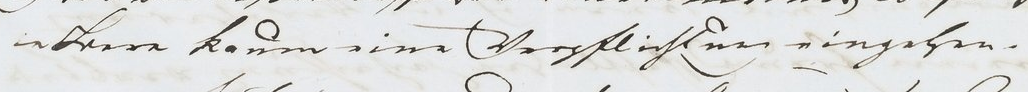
in Bern kaum eine Verpflichtung eingehen.
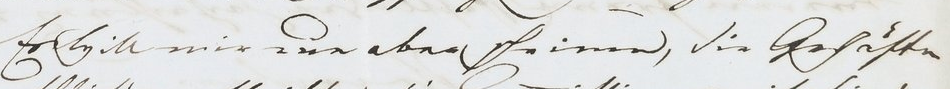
Es will mir nun aber scheinen, die Geschäfte
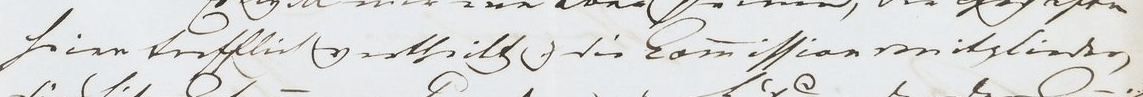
seien trefflich vertheilt & die Commissionsmitglieder,
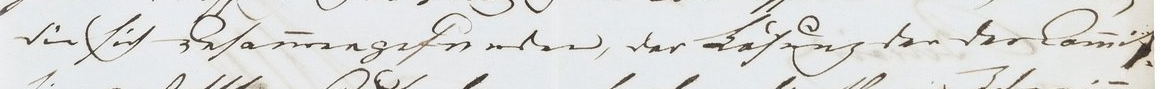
die sich zusammengefunden, der Lösung der der Commis-
